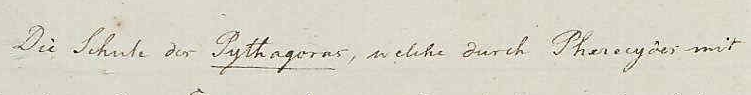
Die Schule des Pythagoras, welche durch Pherecydes mit
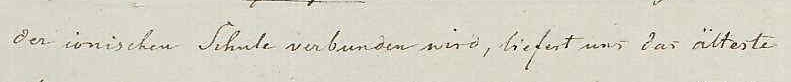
der ionischen Schule verbunden wird, liefert uns das älteste
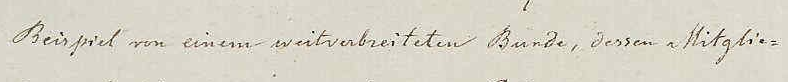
Beispiel von einem weitverbreiteten Bunde, dessen Mitglie-
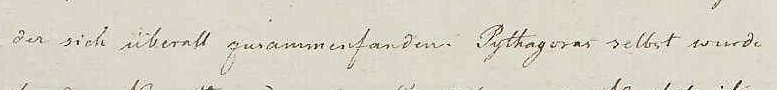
der sich überall zusammenfanden. Pythagoras selbst wurde
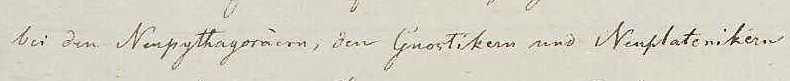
bei den Neupythagoräern, den Gnostikern und Neuplatonikern
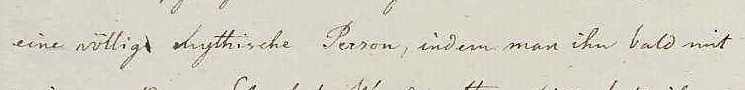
eine völlige mythische Person, indem man ihn bald mit
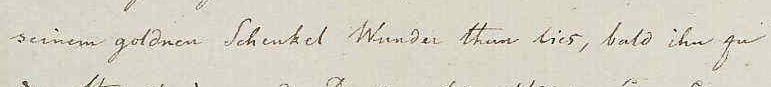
seinem goldnen Schenkel Wunder thun lies, bald ihn zu
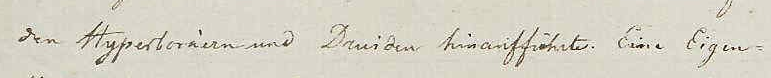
den Hyperboräern und Druiden hinaufführte. Eine Eigen-
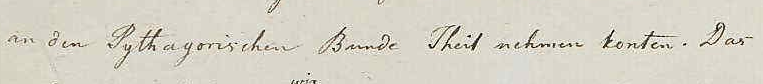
an den Pythagorischen Bunde Theil nehmen konten. Das
